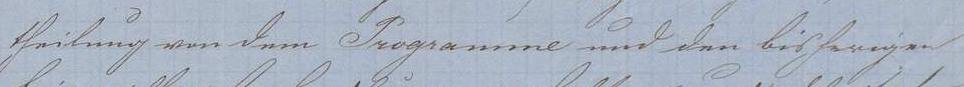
theilung von dem Programme und den bisherigen
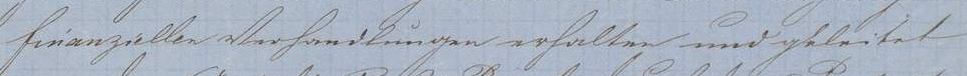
finanziellen Verhandlungen erhalten und geleitet
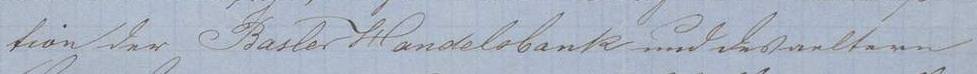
tion der Basler Handelsbank und des aeltern
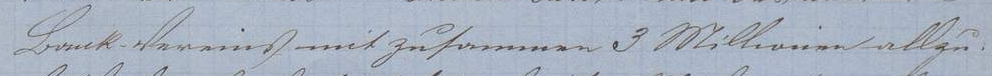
Bank-Vereins mit zusammen 3 Millionen allzu-
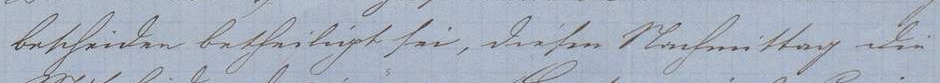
bescheiden betheiligt sei, diesen Nachmittag die
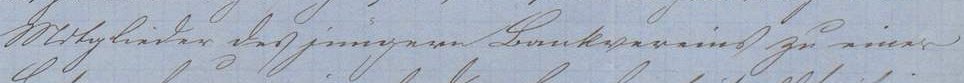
Mitglieder des jüngern Bankvereins zu einer
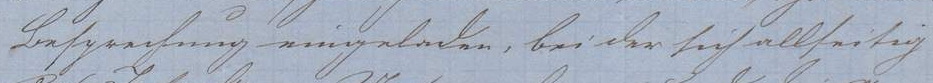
Besprechung eingeladen, bei der sich allseitig
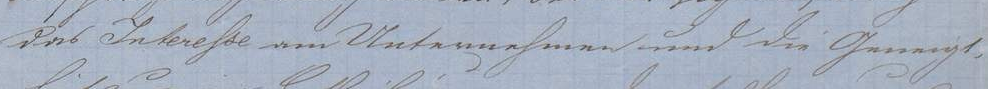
das Interesse am Unternehmen und die Geneigt-
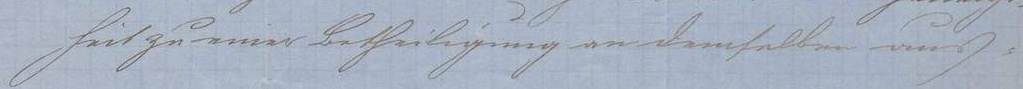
heit zu einer Betheiligung an demselben aus-
